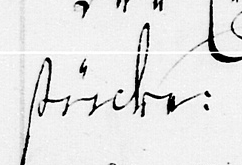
stücke:
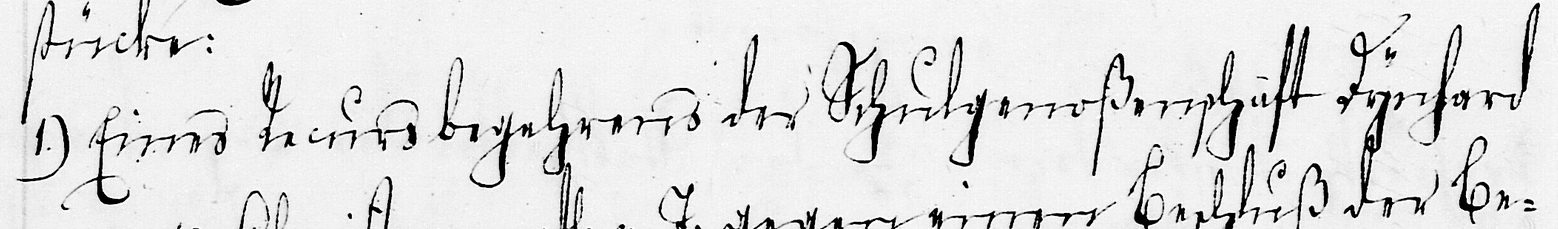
1.) Eines Recursbegehrens der Schulgenoßenschaft Dynhard
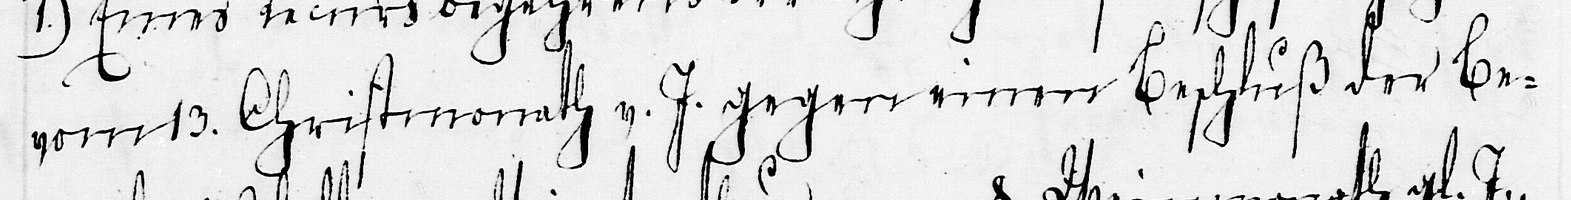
vom 13. Christmonath v. J. gegen einen Beschluß der Be¬
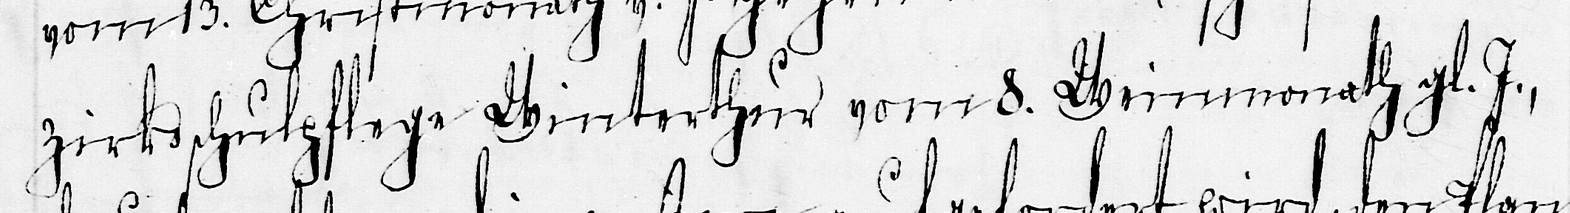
zirksschulpflege Winterthur vom 8. Weinmonath gl. J.,
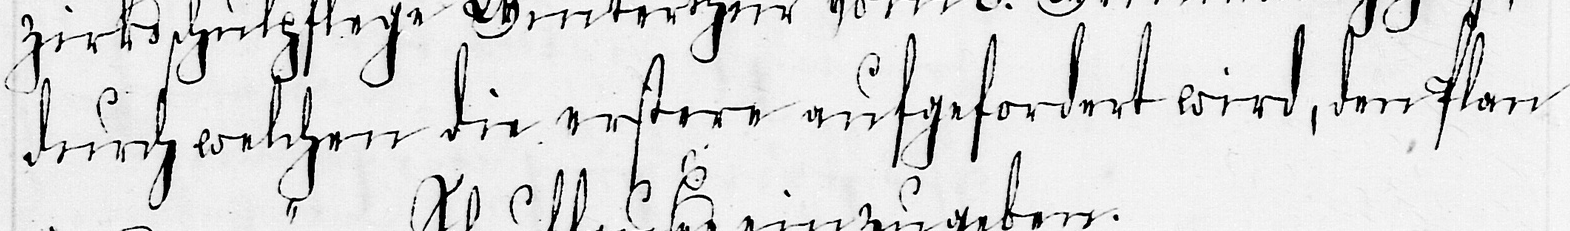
durch welchen die erstere aufgefordert wird, den Plan
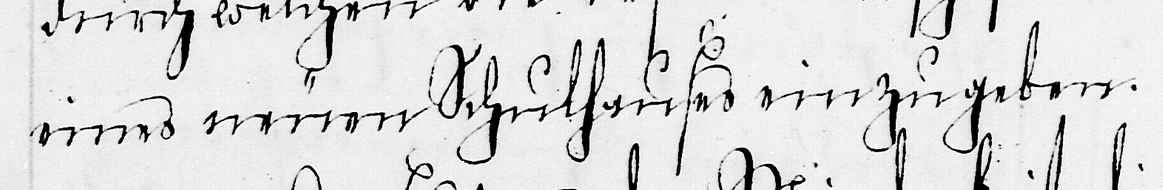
eines neuen Schulhauses einzugeben.
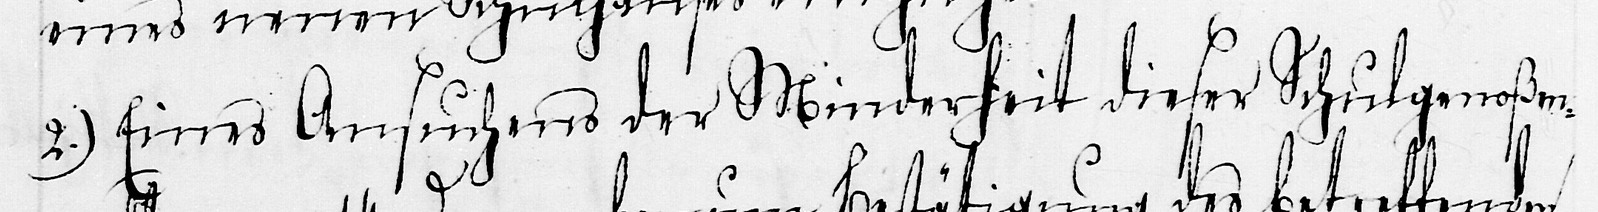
2.) Eines Ansuchens der Minderheit dieser Schulgenoßen¬
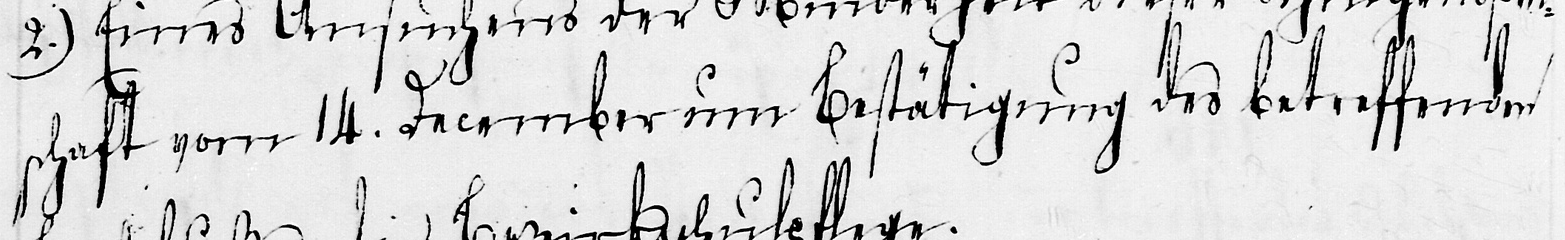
schaft vom 14. December um Bestätigung des betreffenden
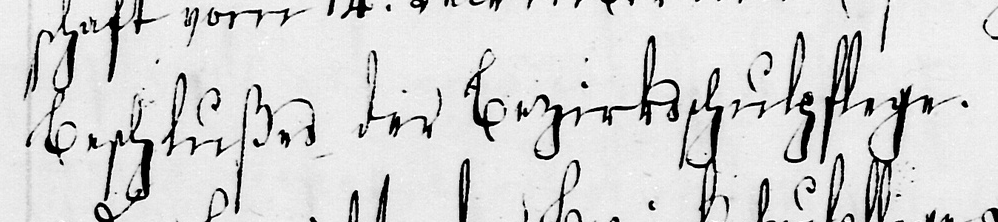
Beschlußes der Bezirksschulpflege.
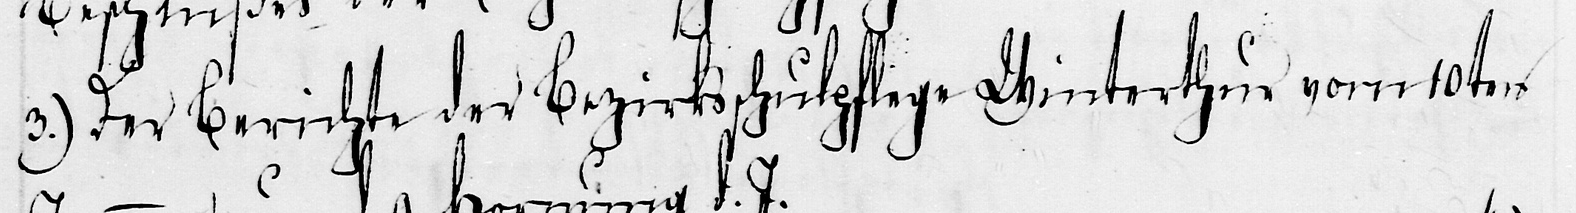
3.) Der Berichte der Bezirksschulpflege Winterthur vom 10ten
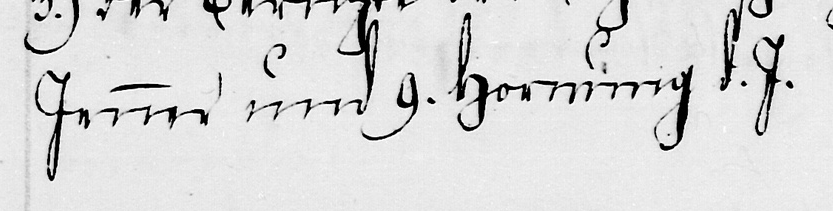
Jenner und 9. Hornung d. J.
